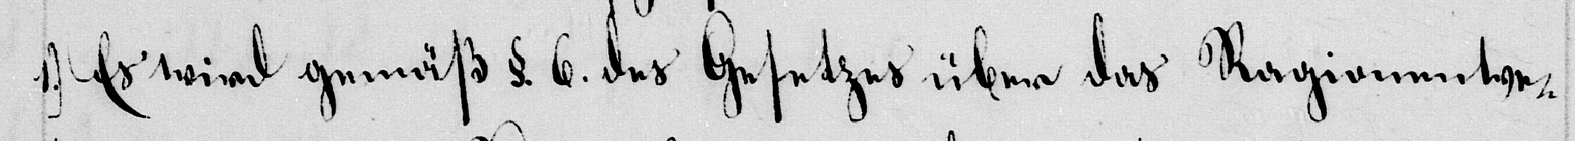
1.) Es wird gemäß §. 6. des Gesetzes über das Ragionenwe¬
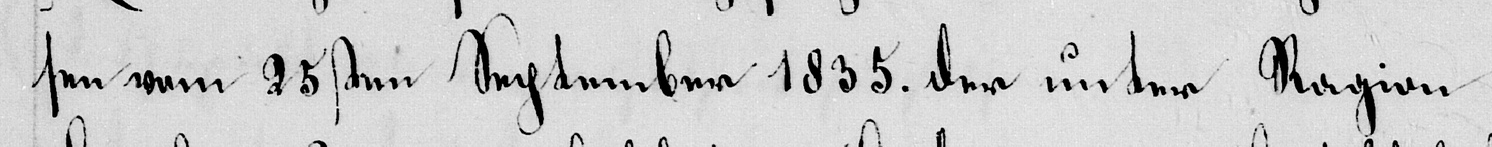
sen vom 25sten September 1835. der unter Ragion
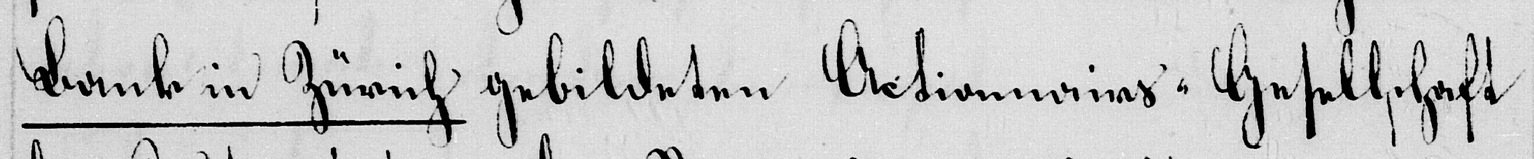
Bank in Zürich gebildeten Actionnairs-Gesellschaft
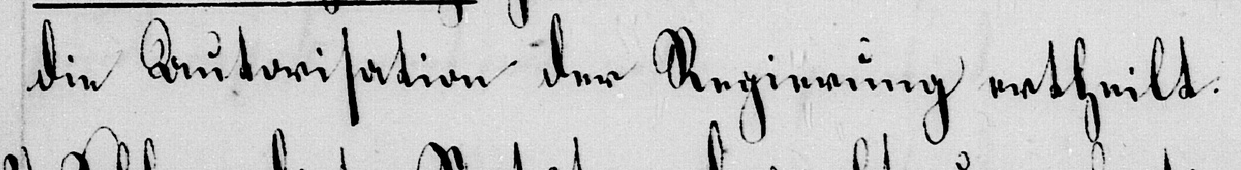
die Autorisation der Regierung ertheilt.
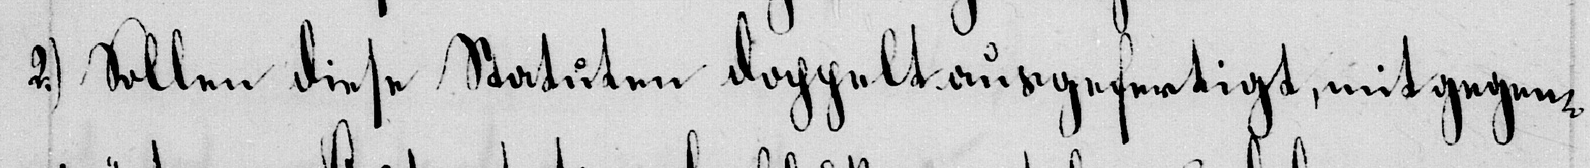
2.) Sollen diese Statuten doppelt ausgefertigt, mit gegen¬
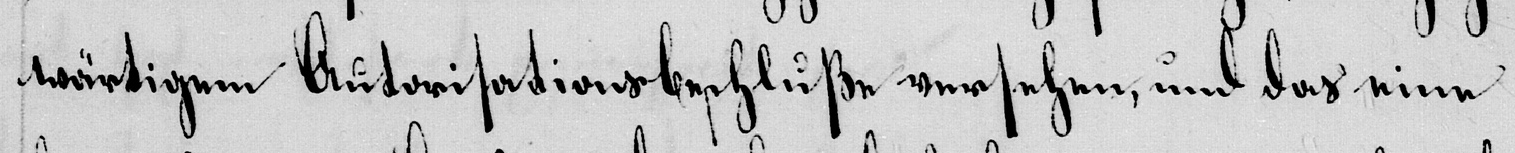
wärtigem Autorisationsbeschluße versehen, und das eine
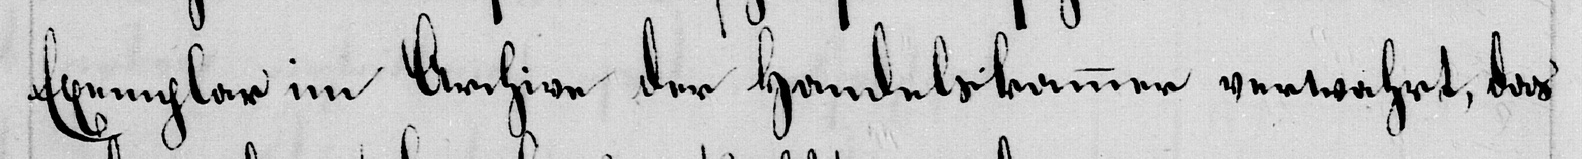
Exemplar im Archive der Handelskammer verwahrt, das
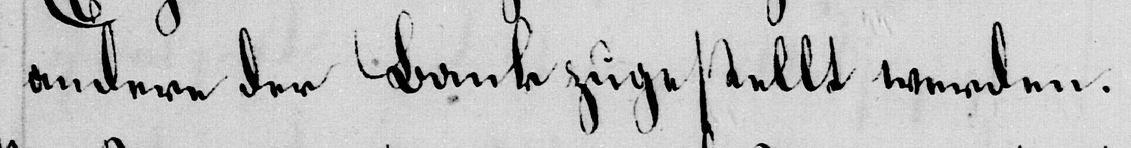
andere der Bank zugestellt werden.
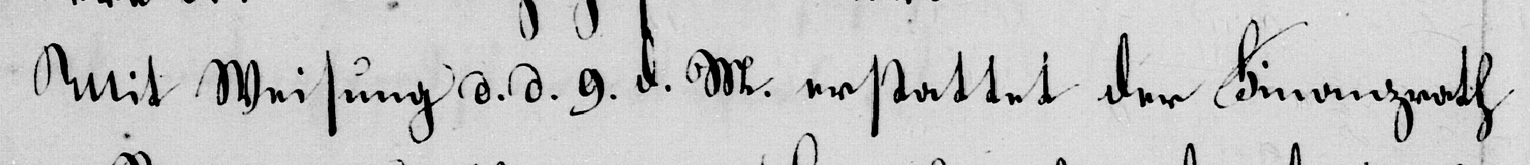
Mit Weisung d. d. 9. d. M. erstattet der Finanzrath
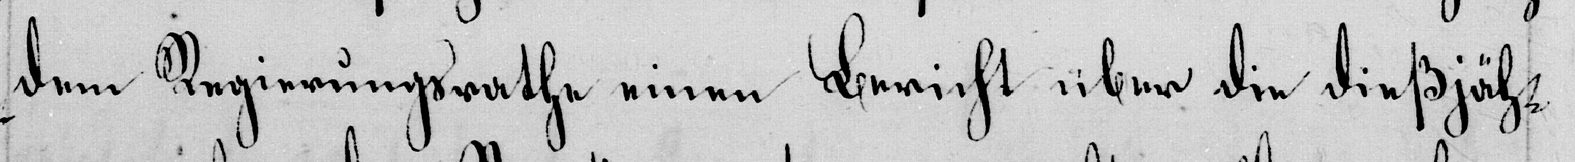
dem Regierungsrathe einen Bericht über die dießjähr¬
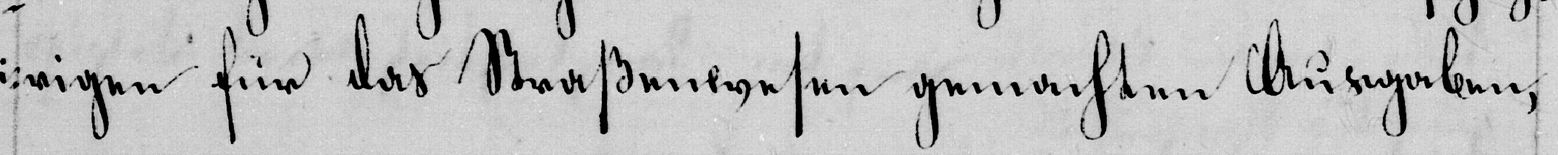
igen für das Straßenwesen gemachten Ausgaben,
